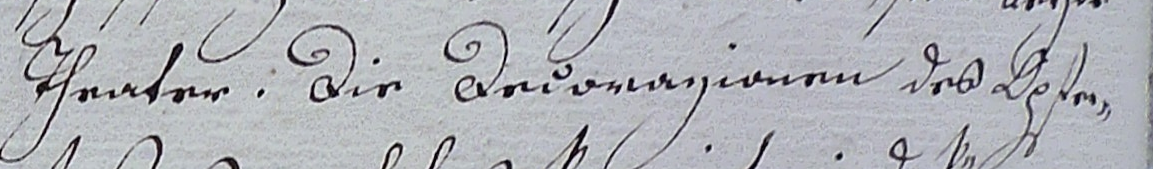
Theater. Die Decorazionen des Opfer¬
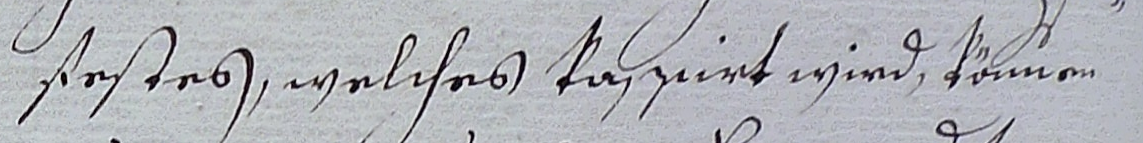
festes, welches kassirt wird, können
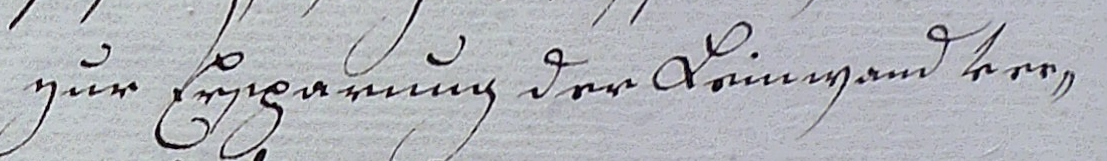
zur Ersparung der Leinwand ver¬
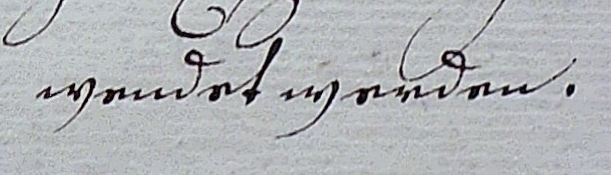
wendet werden.
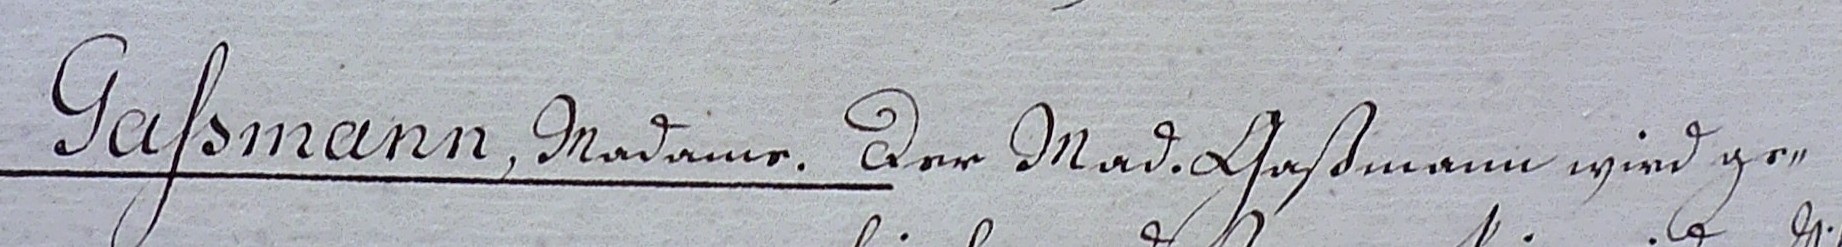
Gassmann, Madame. Der Mad. Gaßmann wird ge¬
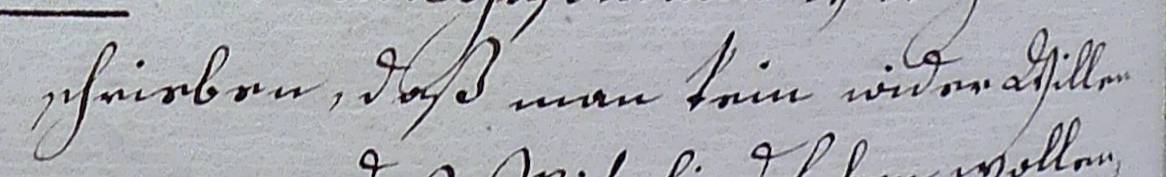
schrieben, daß man kein wider Willen
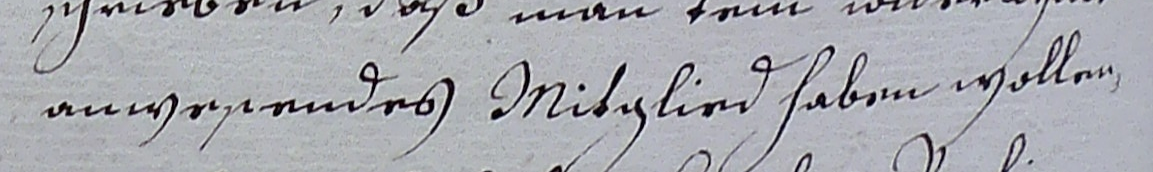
anwesendes Mitglied haben wollen,
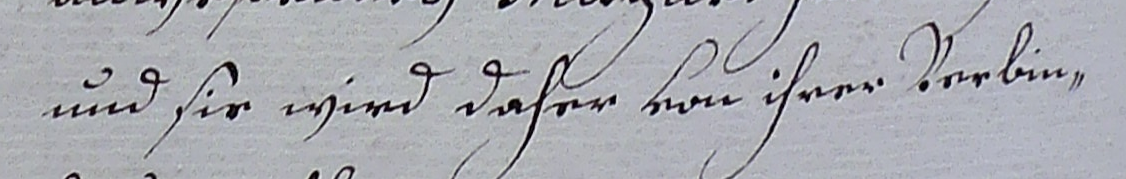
und sie wird daher von ihrer Verbin¬
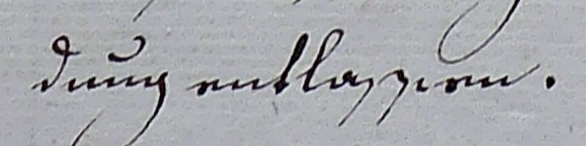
dung entlassen.
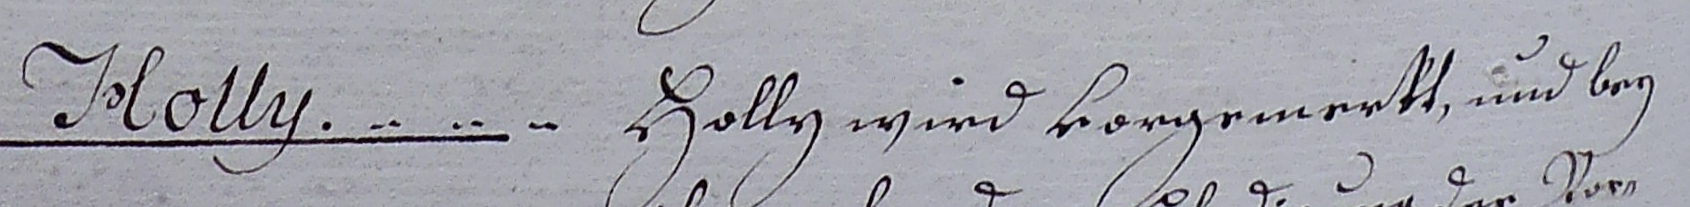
Holly. .. .. .. Holly wird vorgemerkt, und bey
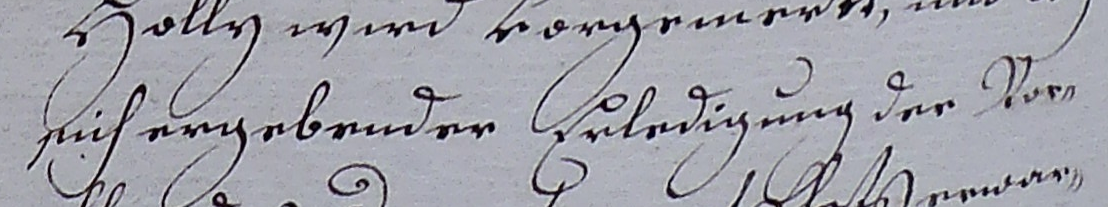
sich ergebender Erledigung der Vor¬
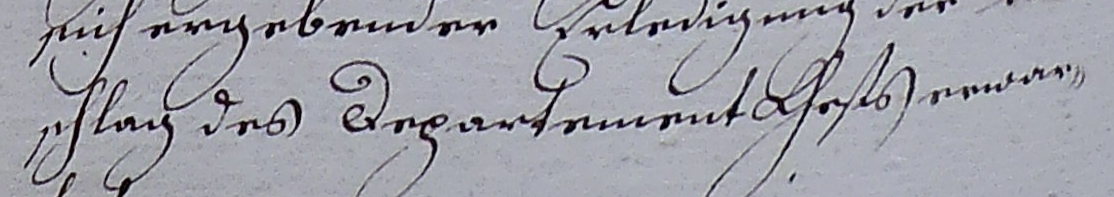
schlag des Departement Chefs erwar¬
